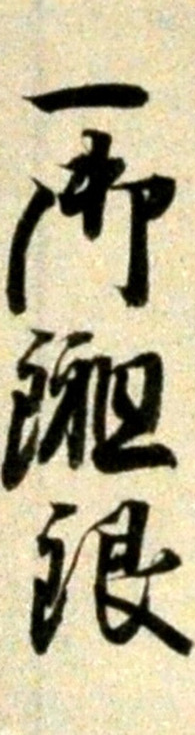一御鎺銀
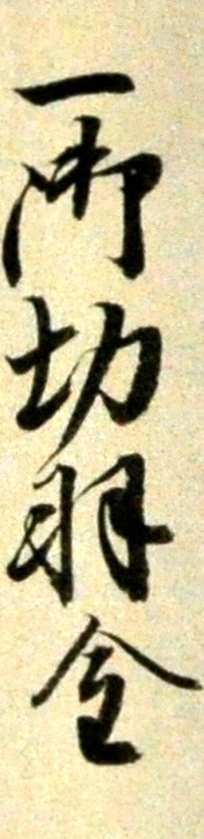一御切羽金
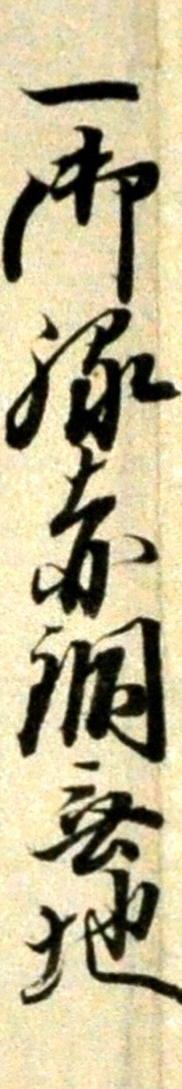一御縁赤胴無地
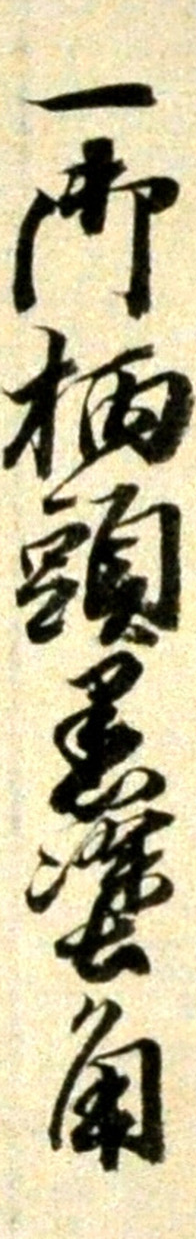一御柄頭黒塗角
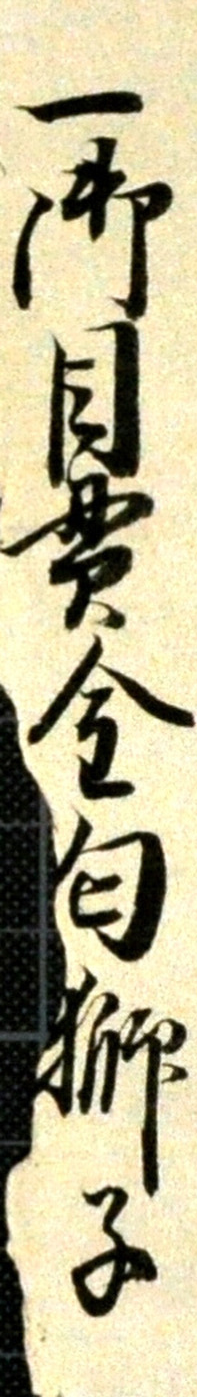一御目貫金匂獅子
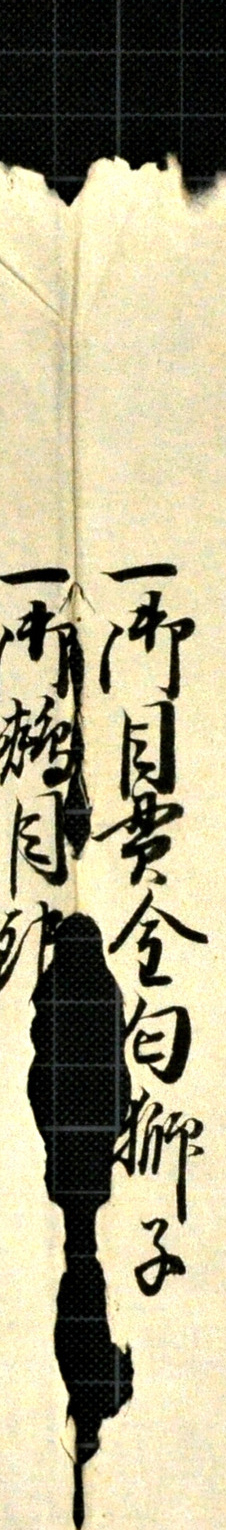一御目貫金匂獅子
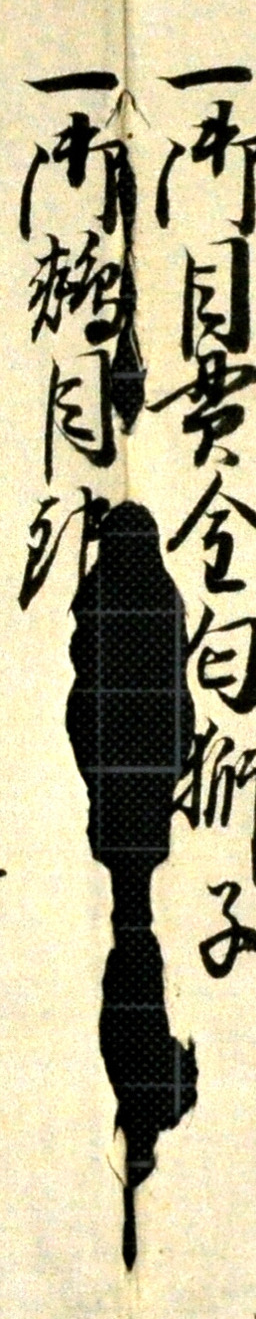一御鵊目銀
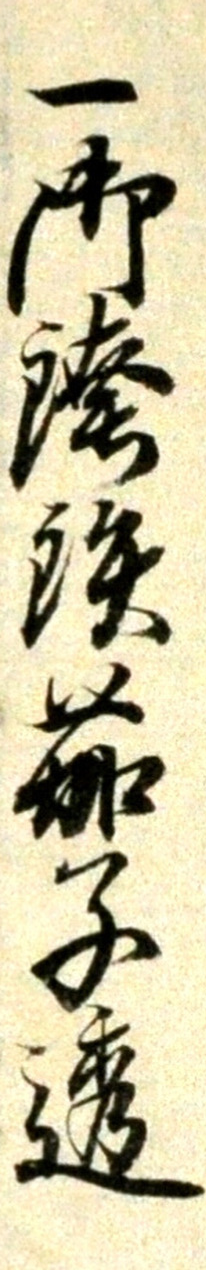一御鍔鉄茄子透
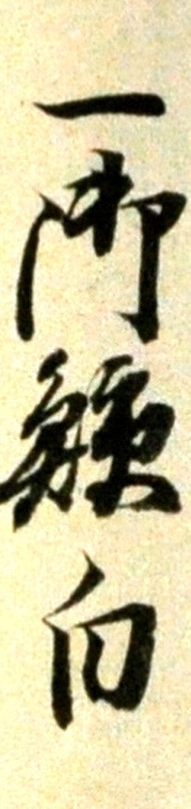一御鮫白
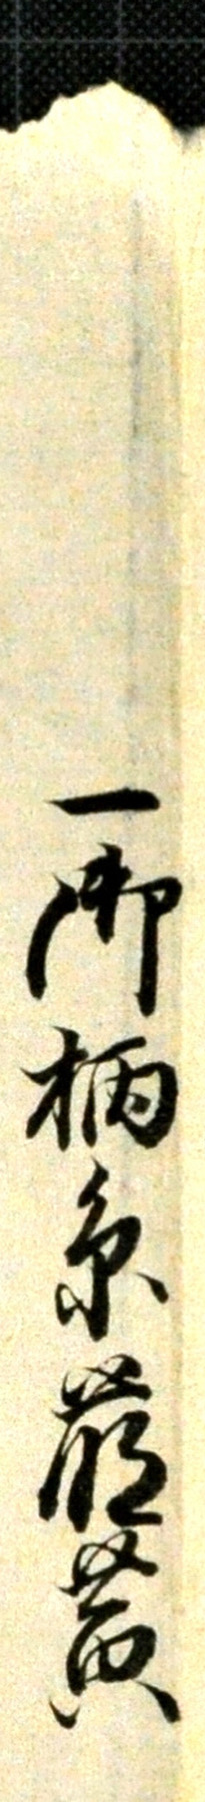一御柄糸萌黄
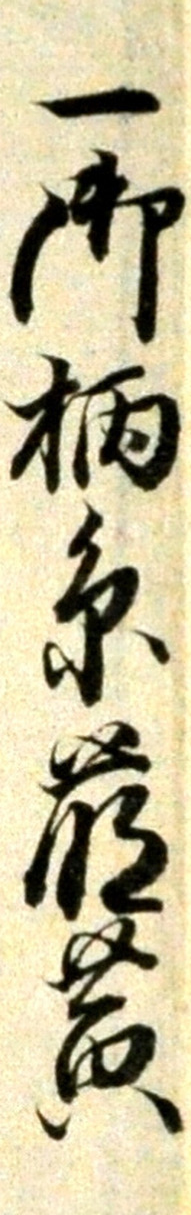一御柄糸萌黄
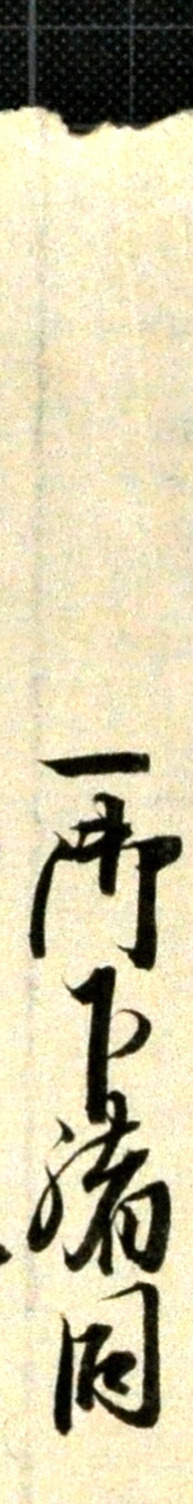一御下緒同
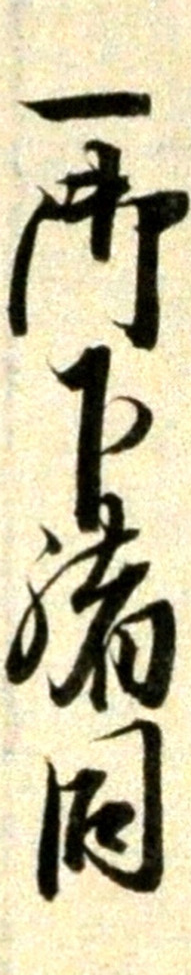一御下緒同
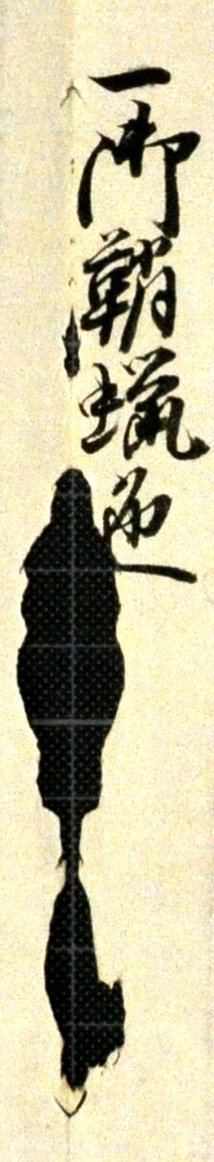一御鞘蝋色
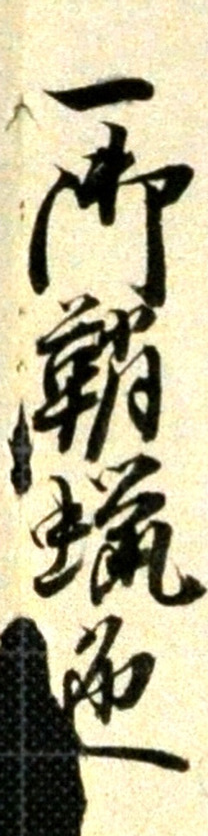一御鞘蝋色
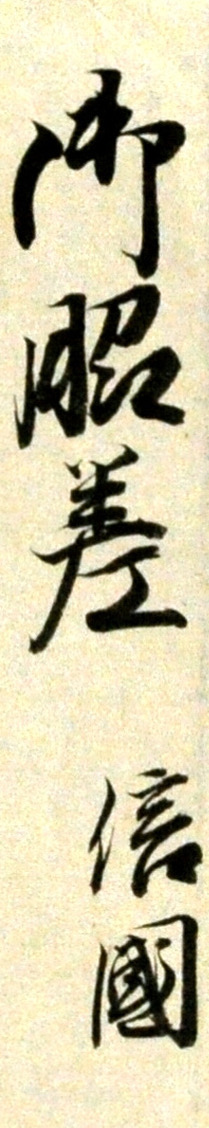御脇差信国
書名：御拵書
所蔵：伊那市立高遠町図書館・合同会社AMANE
